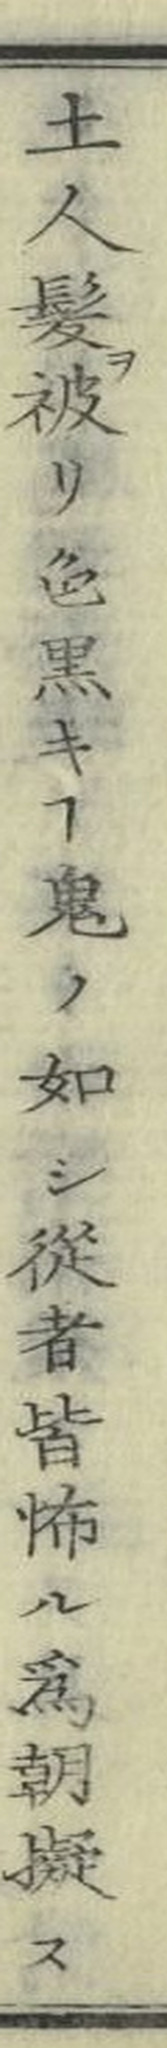土人髮被リ色黑キコト鬼ノ如シ從者皆怖ル爲朝擬ス
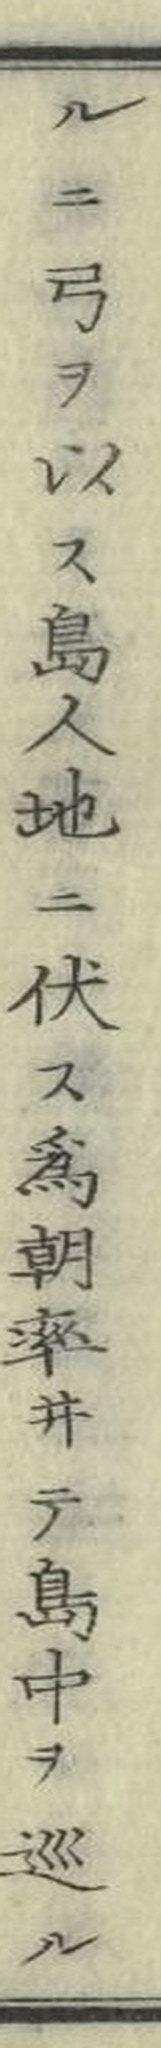ルニ弓ヲ以ス島人地ニ伏ス爲朝率ヰテ島中ヲ巡ル
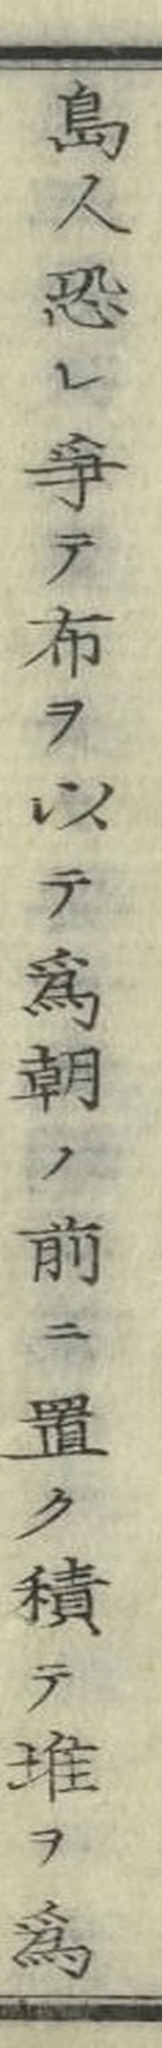島人恐レ爭テ布ヲ以テ爲朝ノ前ニ置ク積テ堆ヲ爲
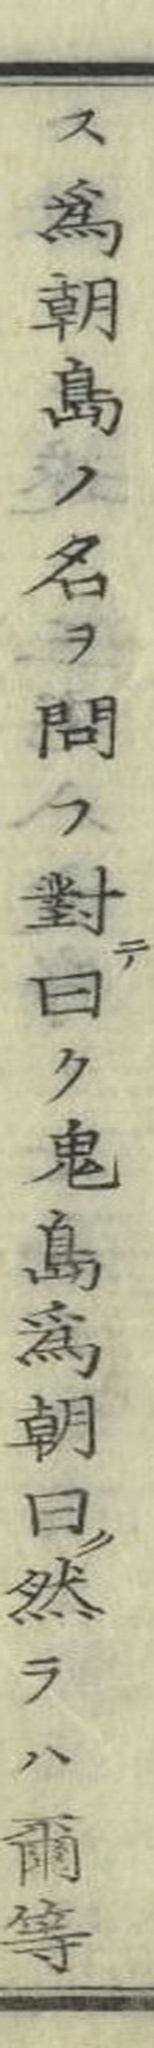ス爲朝島ノ名ヲ問フ對曰ク鬼島爲朝曰然ラハ爾等
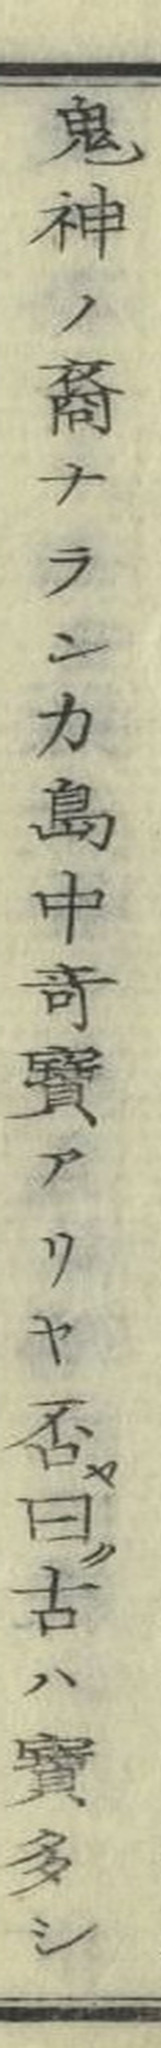鬼神ノ裔ナランカ島中奇寶アリヤ否曰古ハ寶多シ
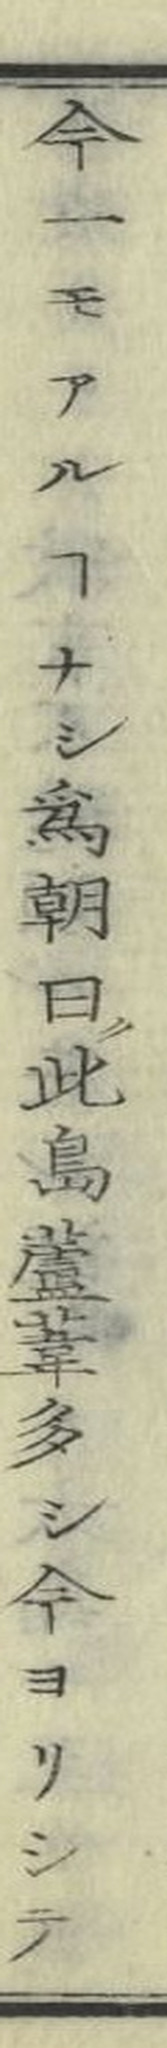今一モアルコトナシ爲朝曰此島蘆葦多シ今ヨリシテ
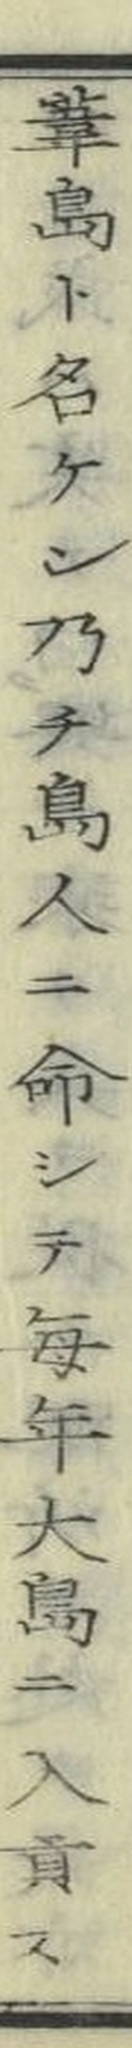葦島ト名ケン乃チ鳥人ニ命シテ每年大島ニ入貢ス
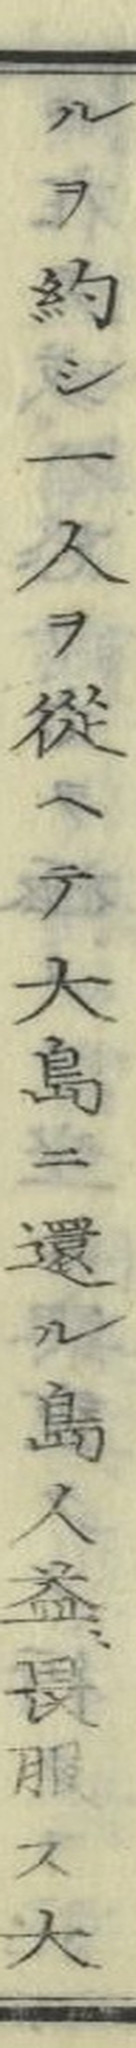ルヲ約シ一人ヲ從ヘテ大島ニ還ル島人益〻長服ス大
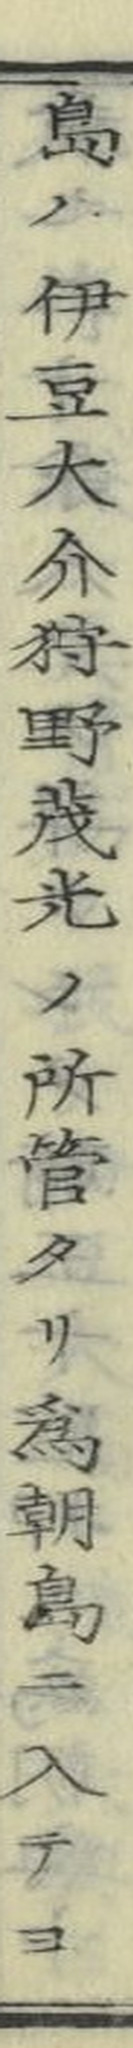島ハ伊豆大介狩野茂光ノ所管タリ爲朝島ニ入テヨ
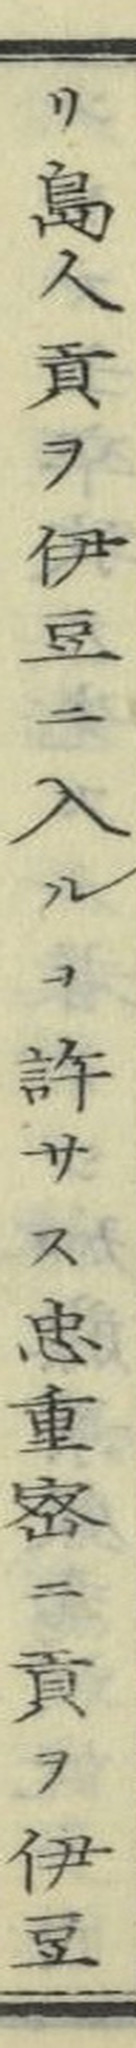リ島人貢ヲ伊豆ニ入ルヲ許サス忠重密ニ貢ヲ伊豆
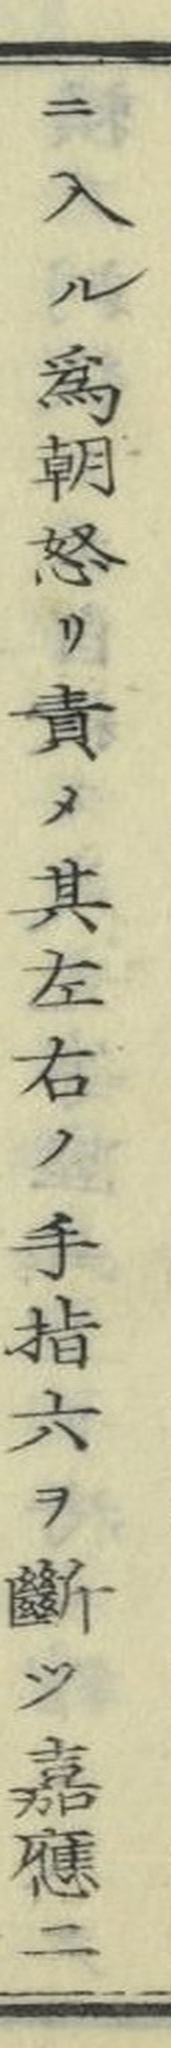ニ入ル爲朝怒リ責メ其左右ノ手指六ヲ斷ツ嘉應二
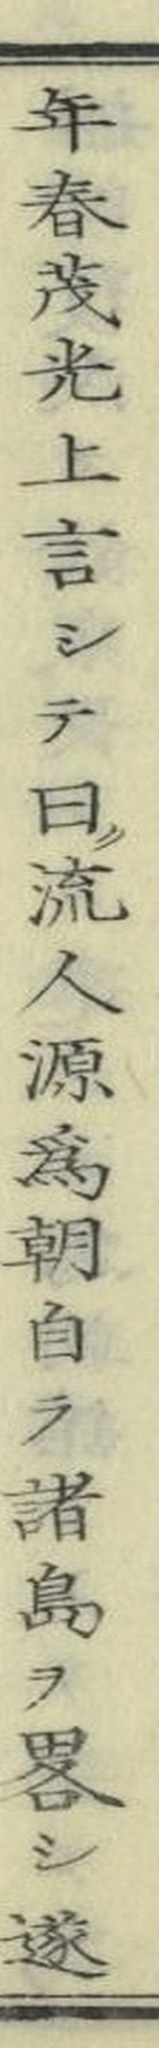年春茂光上言シテ曰流人源爲朝自ラ諸島ヲ畧シ遂
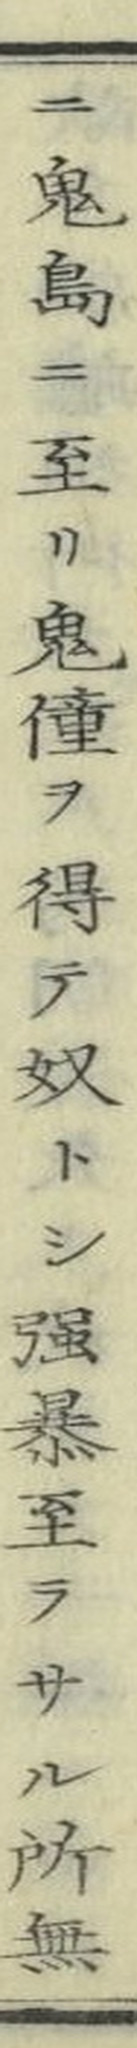ニ鬼島ニ至リ鬼僮ヲ得テ奴トシ强暴至ラサル所無
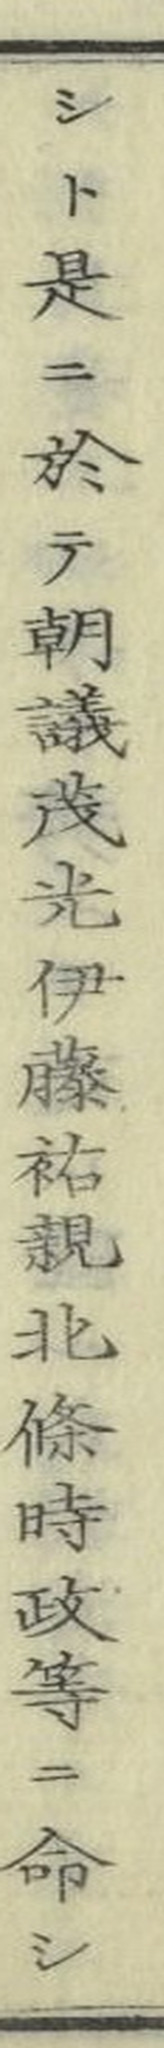シト是ニ於テ朝議茂光伊藤祐親北條時政等ニ命シ
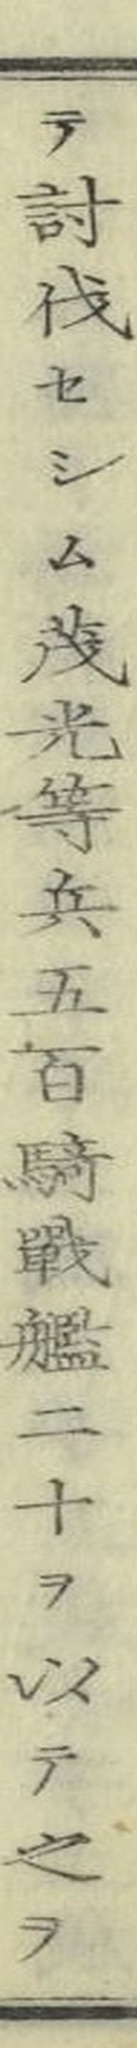テ討伐セシム茂光等兵五百騎戰艦二十ヲ以テ之ヲ
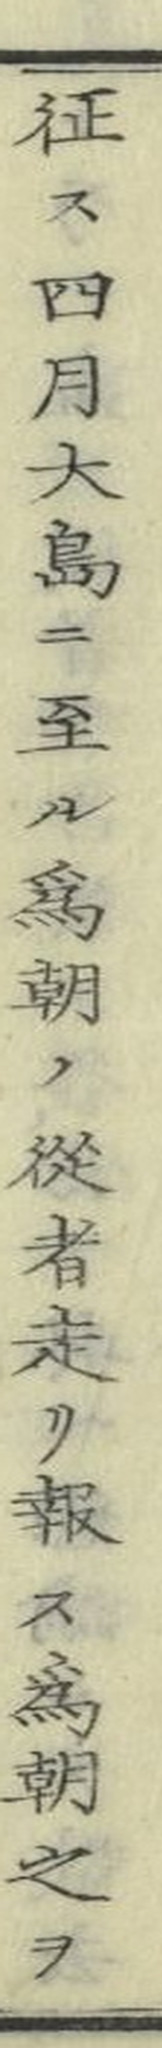征ス四月大島ニ至ル爲朝ノ從者走リ報ス爲朝之ヲ
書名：琉球藩史 一之巻
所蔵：University of the Ryukyus Library
